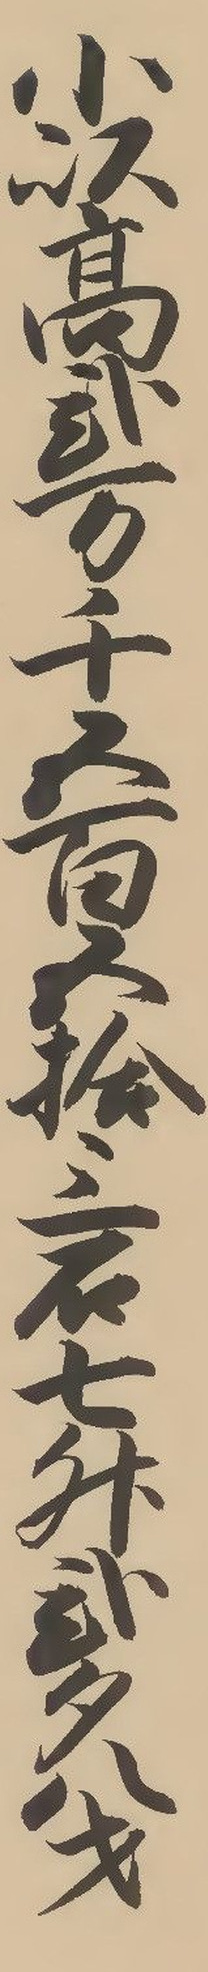小以高弐万千五百五拾三石七升弐勺八才

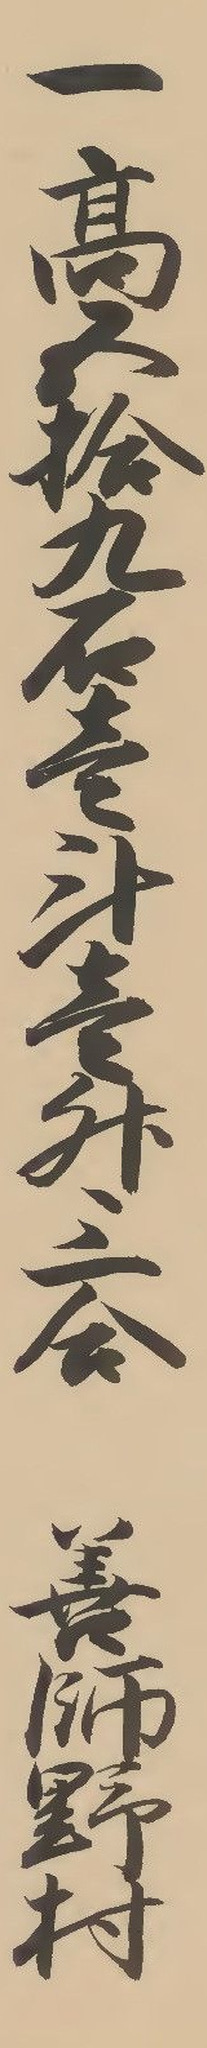一高五拾九石壱斗壱升三合善師野村
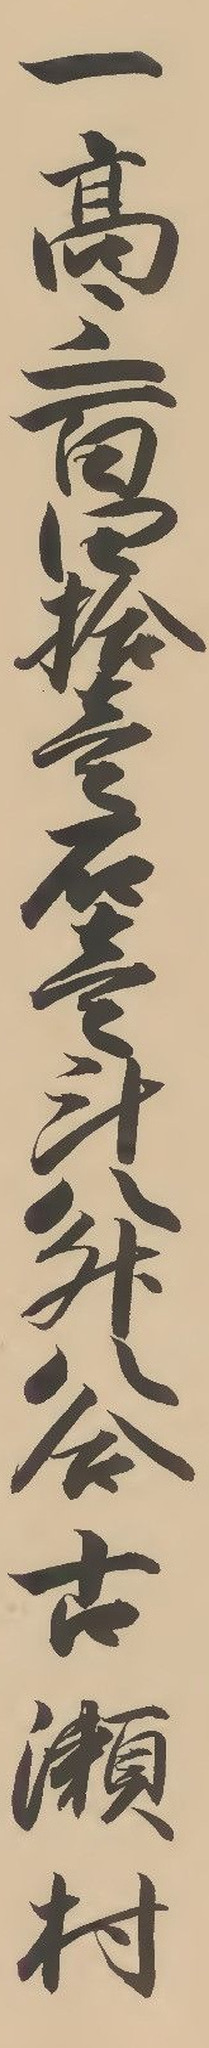一高三百四拾壱石壱斗八升八合古瀬村
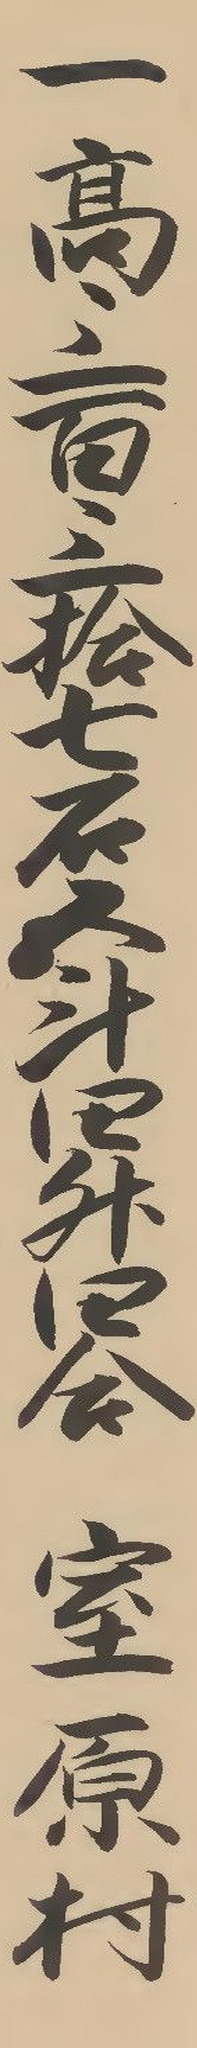一高三百三拾七石五斗四升四合室原村
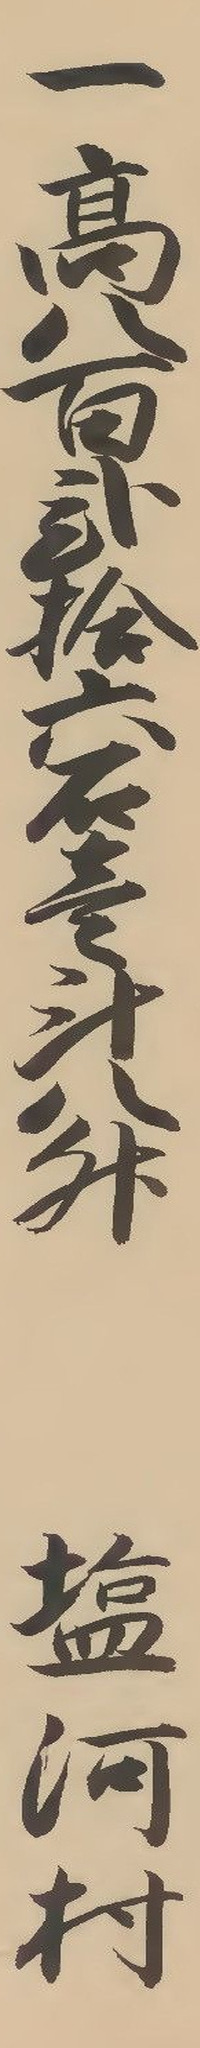一高八百弐拾六石壱斗八升塩河村
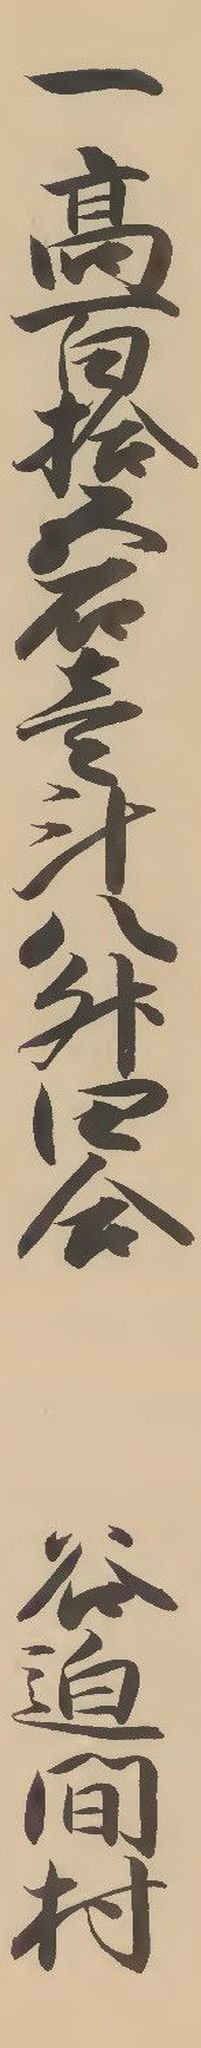一高百拾五石壱斗八升四合谷迫間村

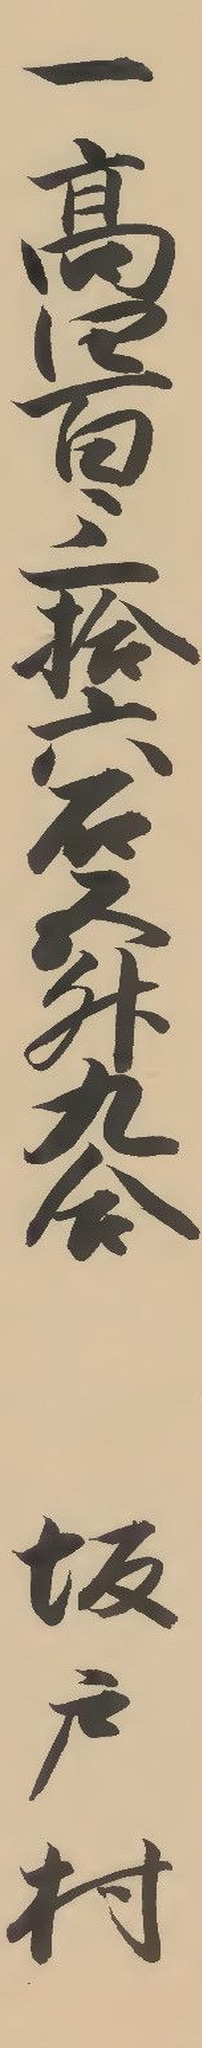一高四百三拾六石五升九合坂戸村
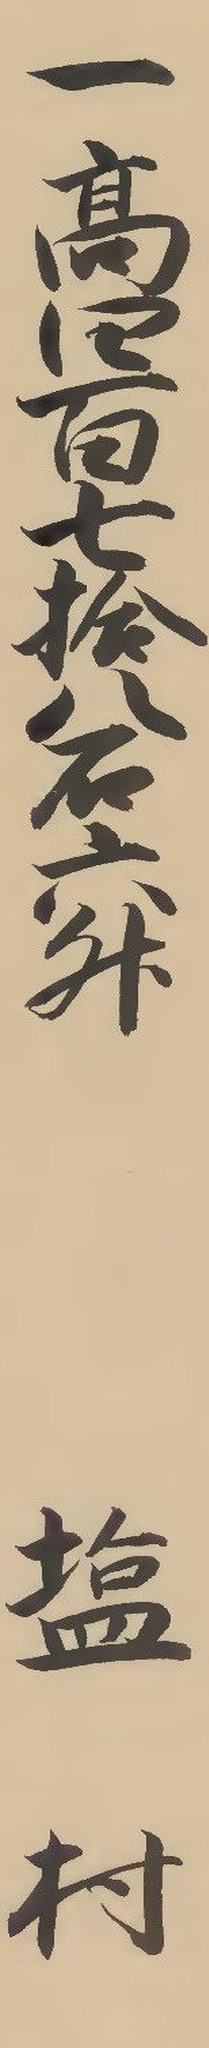一高四百七拾八石六升塩村
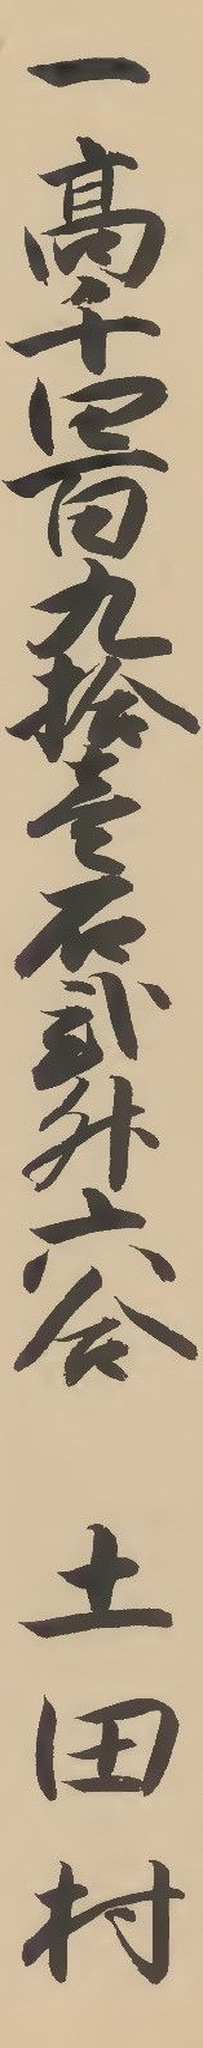一高千四百九拾壱石弐升六合土田村
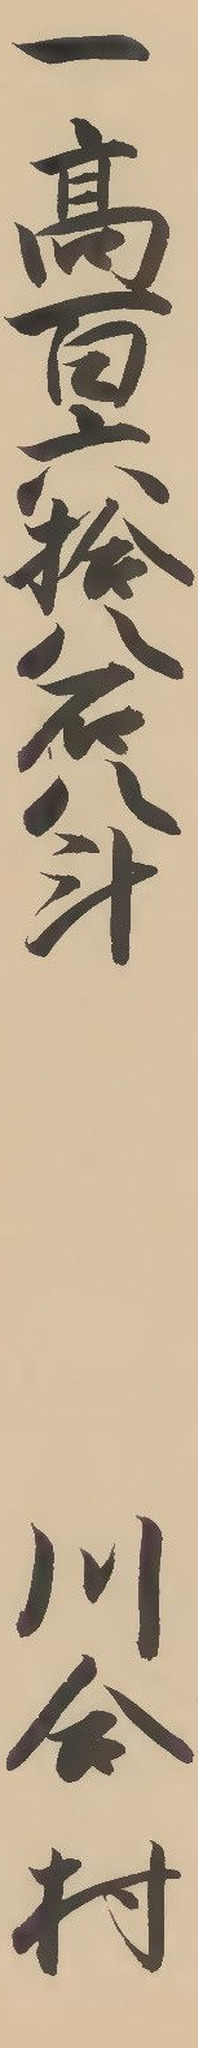一高百六拾八石八斗川合村

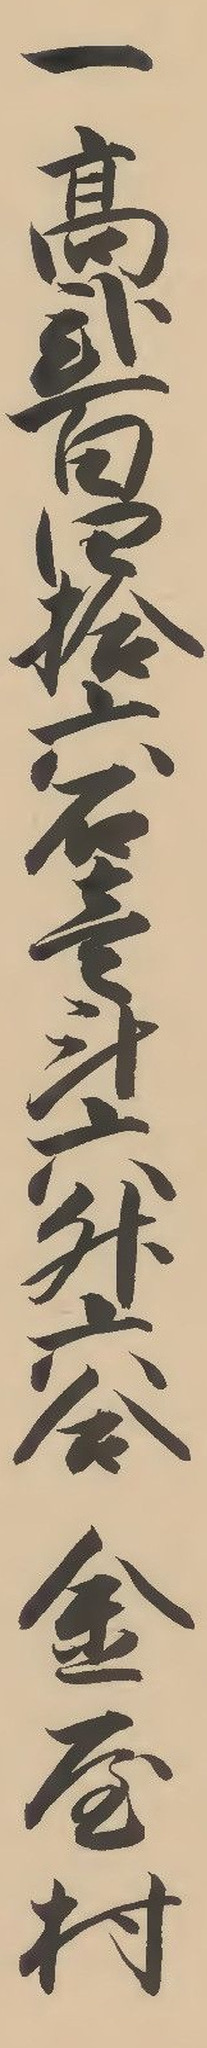一高弐百四拾六石壱斗六升六合金屋村
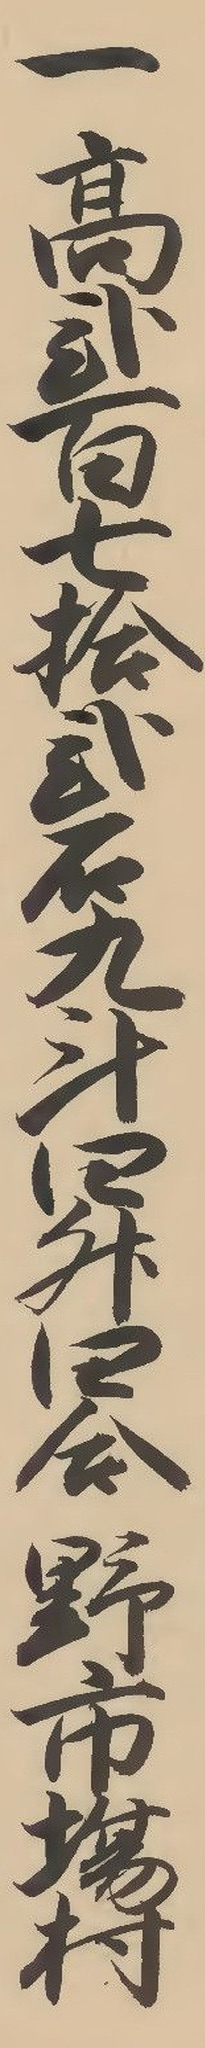一高弐百七拾弐石九斗四升四合野市場村
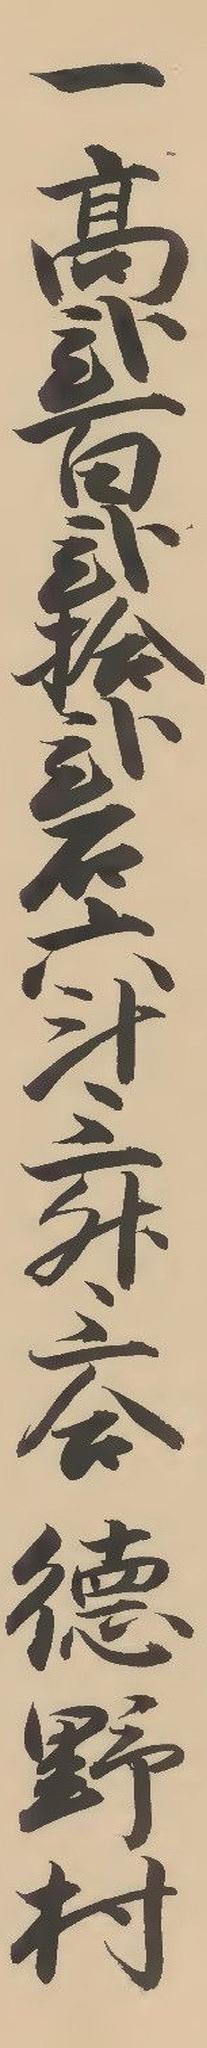一高弐百弐拾弐石六斗三升三合徳野村
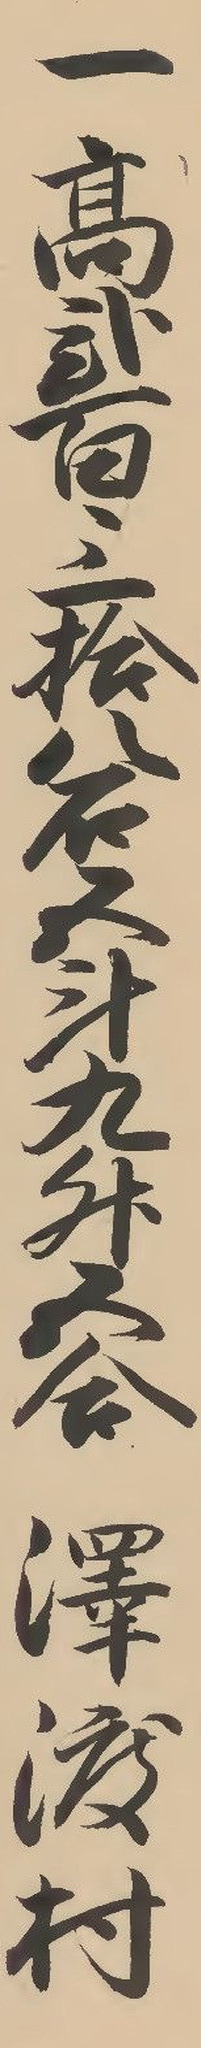一高弐百三拾八石五斗九升五合沢渡村
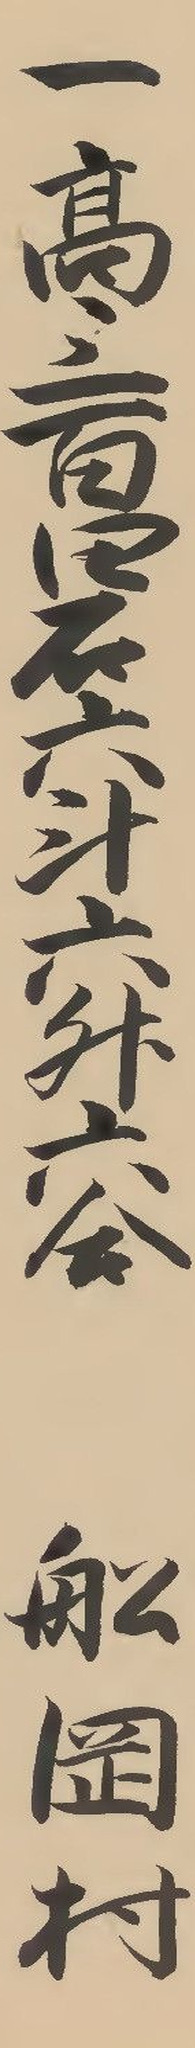一高三百四石六斗六升六合船岡村
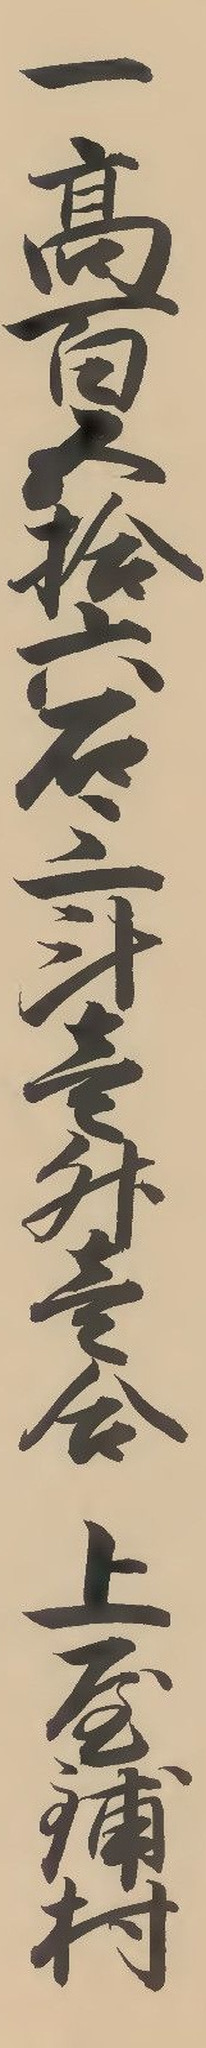一高百五拾六石三斗壱升壱合上屋鋪村
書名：美濃国郷帳
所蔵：国立公文書館 National Archives of Japan
